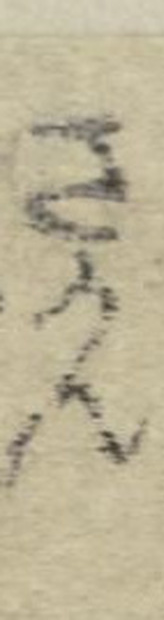さかん
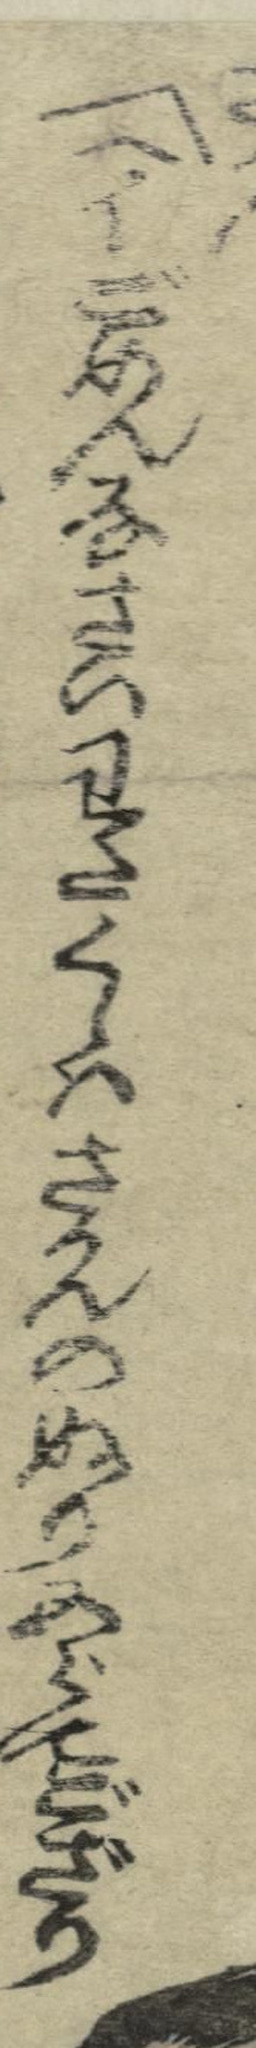〽ヘイごめんなさいわたくしはさかんのぬり五郎てござり
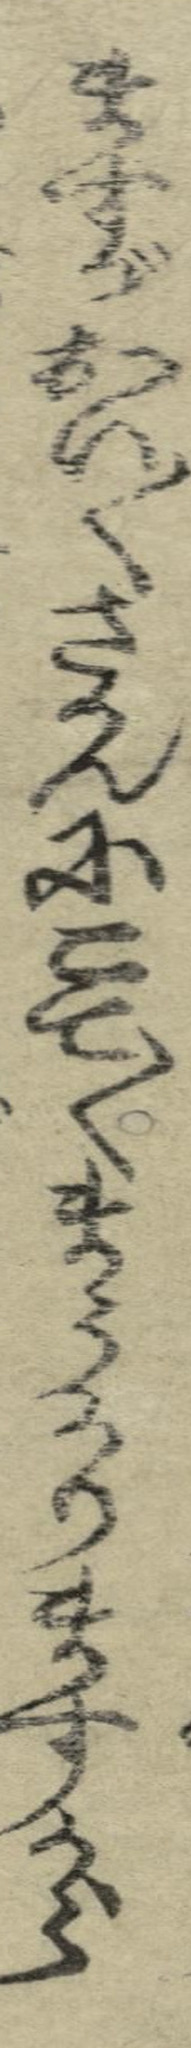ますがおい〳〵さかんにこて〳〵まうかりますから
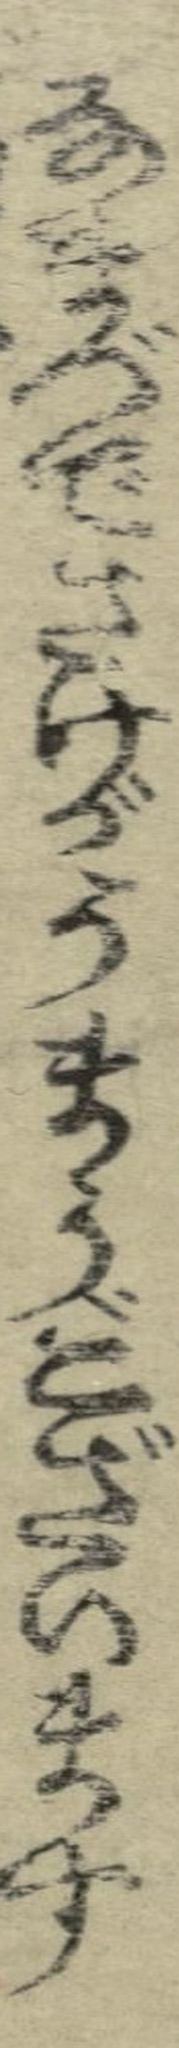なまづでさけがうまうございます
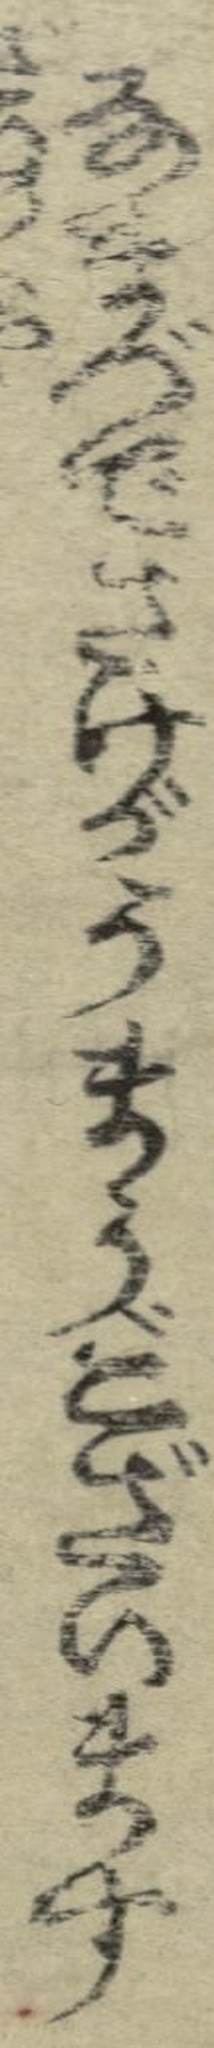なまづでさけがうまうございます
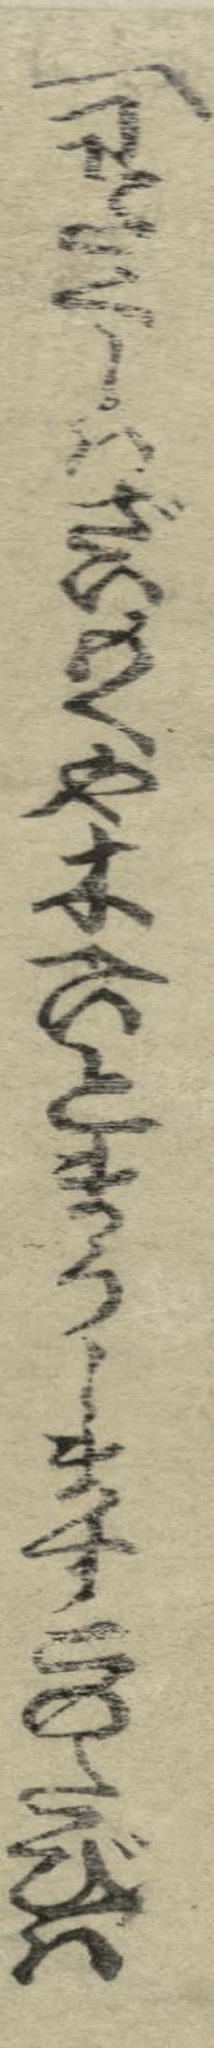〽私はざいもくや木へいとまうしますこのたびは
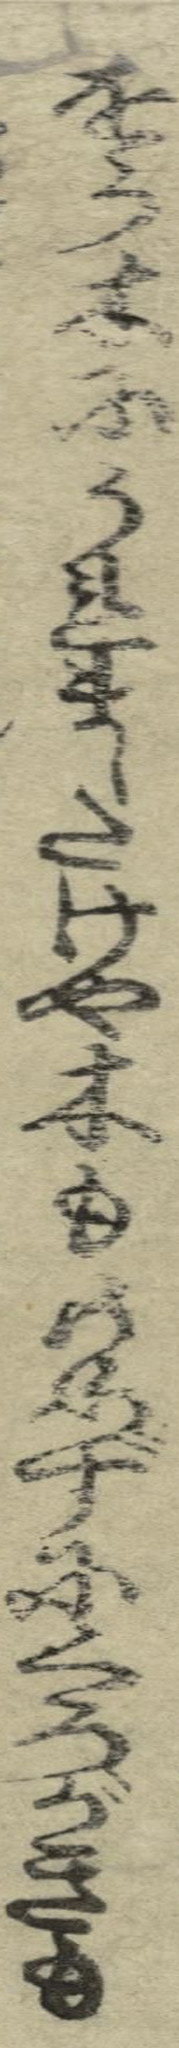をう木にうれましたけや木ももゑずにくろがきも
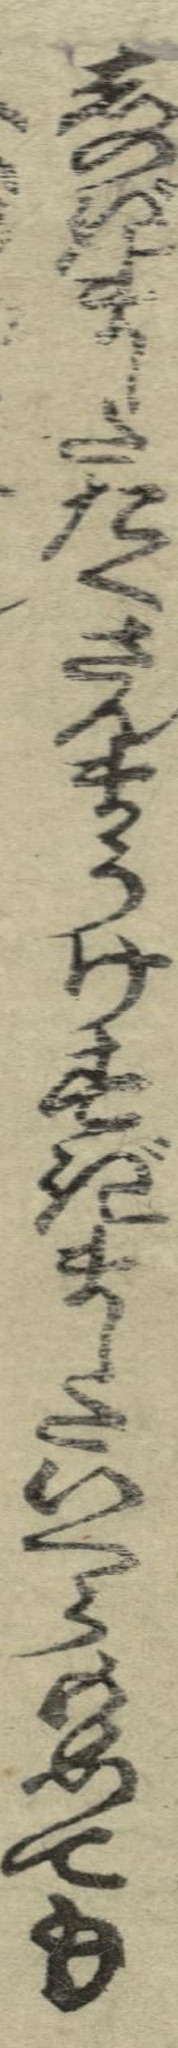しのぎましたたくさんまうけすぎましたいくらもめても
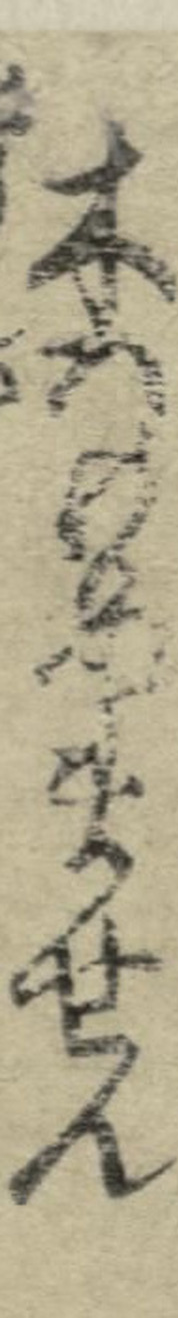木はもめません
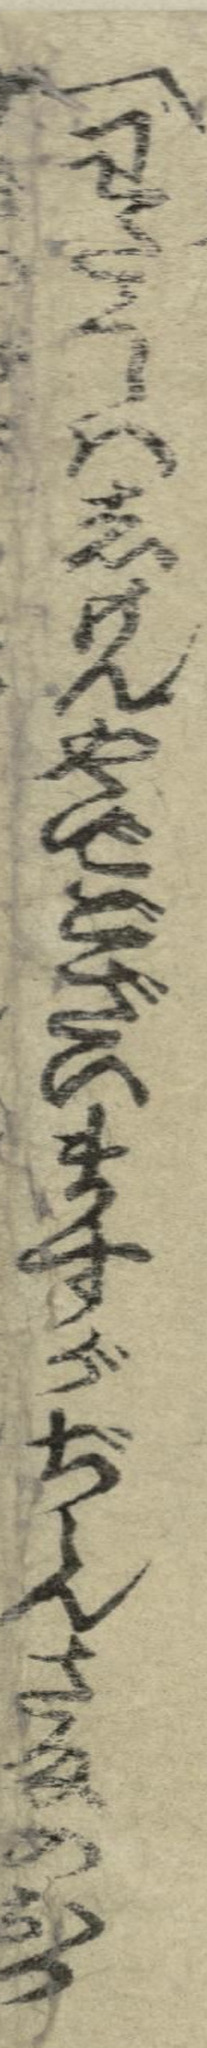〽わたくしはしけんやでございますがぢしんさまのおか
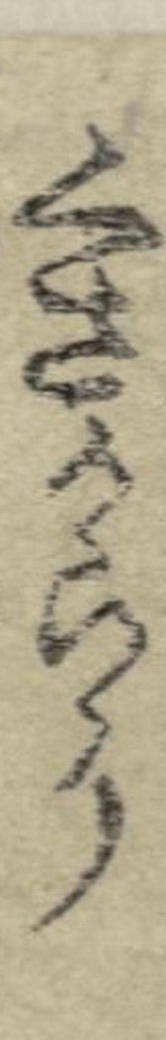くさからう
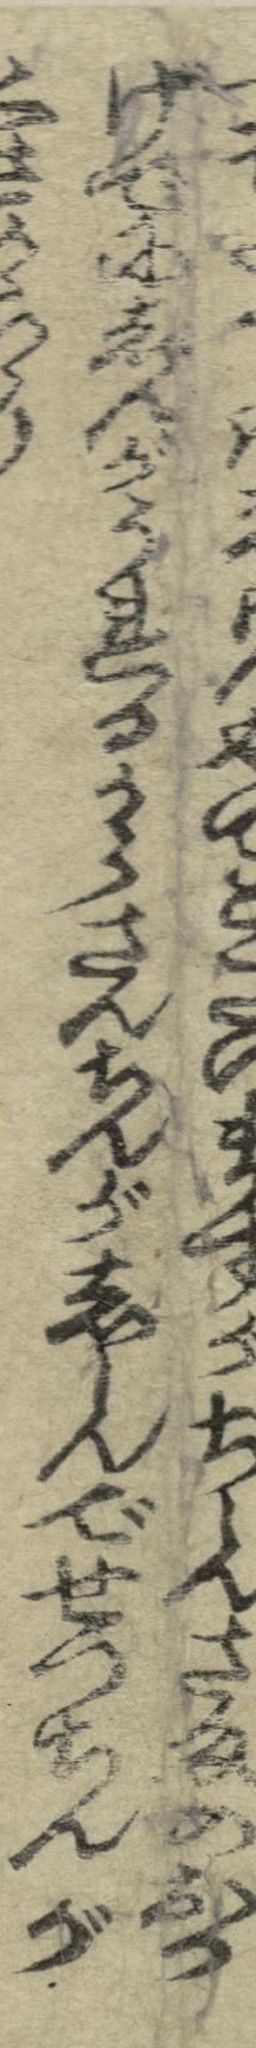げでにしんがうれるからさんちんがししんでせつちんが
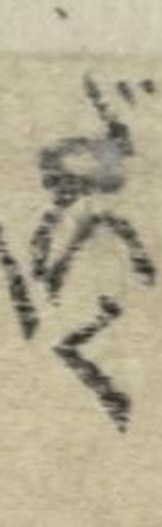だいく
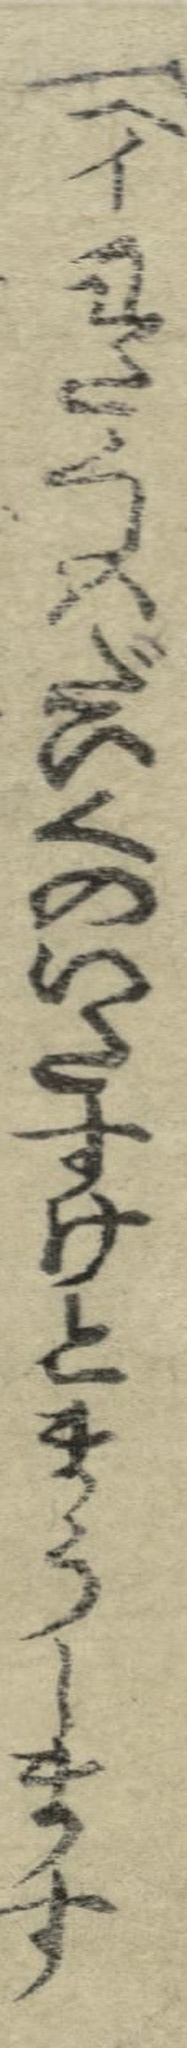〽ヘイわたくしはだいくのいたすけとまうします
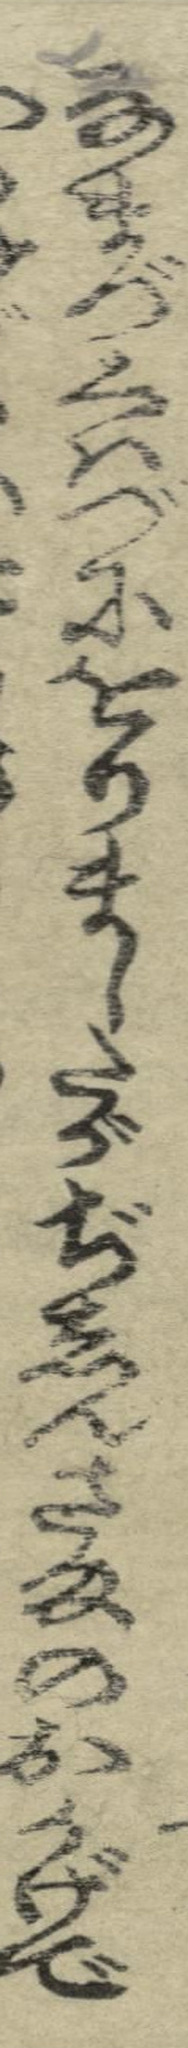なまづくはづにをりましたがぢしんさまのおかげで
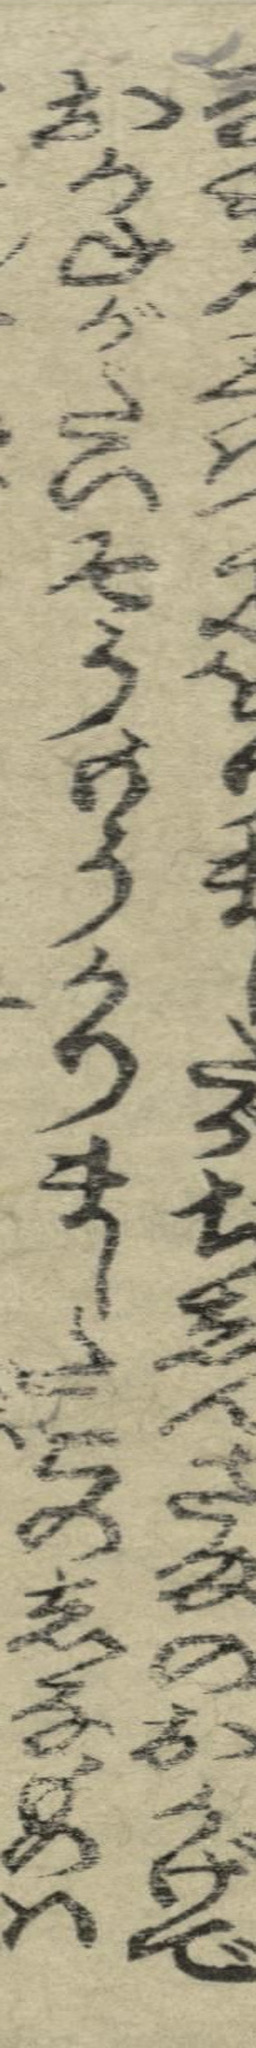おかねがたいそうもうかりましたこのしなものは
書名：[鯰への見舞い]
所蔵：東京大学地震研究所図書室 Earthquake Research Institute Library, The University of Tokyo, JAPAN
